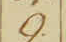9.
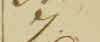7.
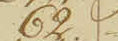62.
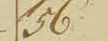56
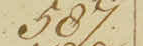587.
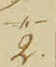2.
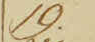19.
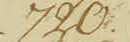720.
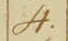4.
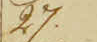27.
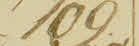109.
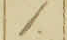1.
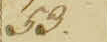53.
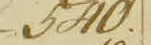540.
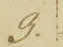3.
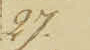27.
